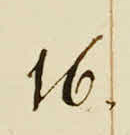16
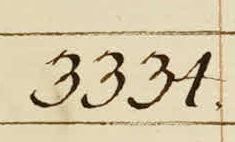3334
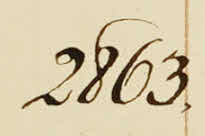2863
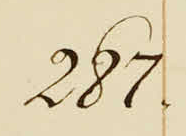287
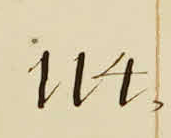114
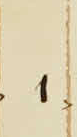1
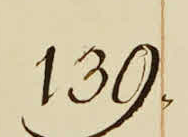139
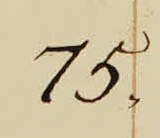75
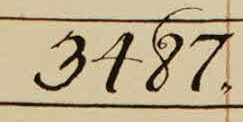3487
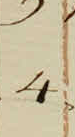4
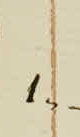1
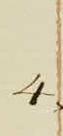4
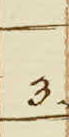3
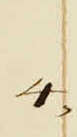4
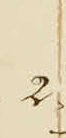2
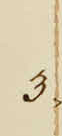3
